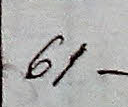61
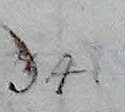34
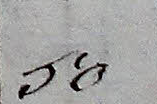50
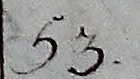53
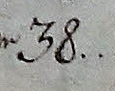38
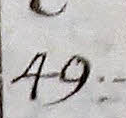49
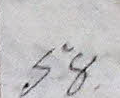58
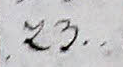23.
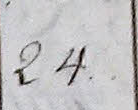24.
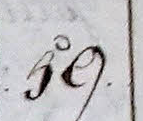59.
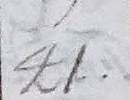41.
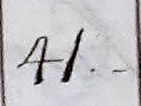41.
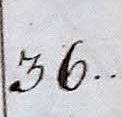36
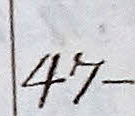47
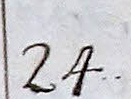24
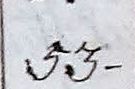53
